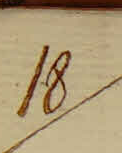18
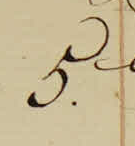5.
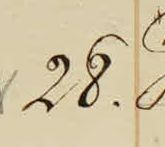28.
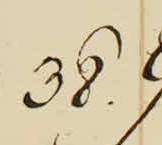38.
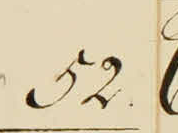52.
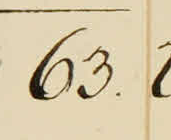63.
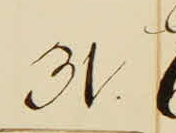31.
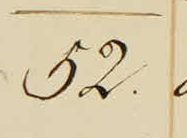52.
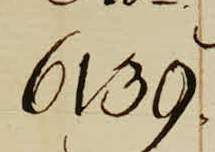6139
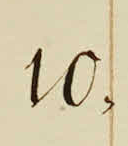10
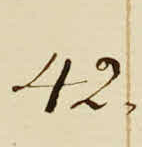42
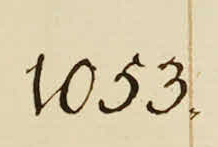1053
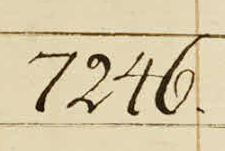7246
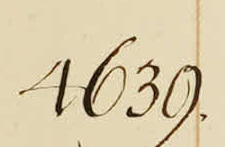4639
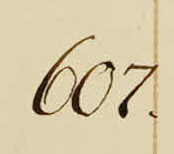607
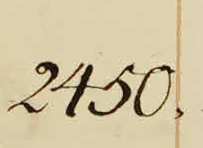2450
